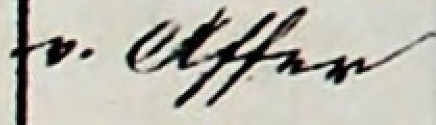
v. Affer
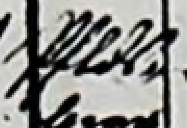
Pflds„
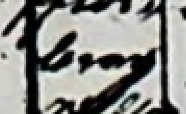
berg
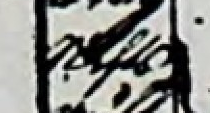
Stifs
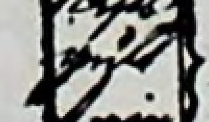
gütt
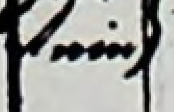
lein
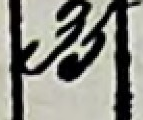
35
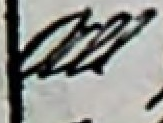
Alt
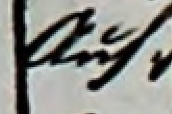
Aus
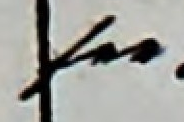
see
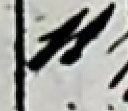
11
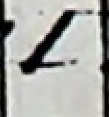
I
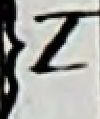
I
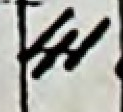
41
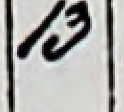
13
